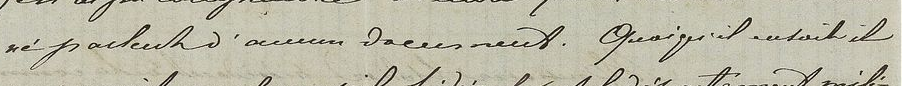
ne parlent d'aucun document. Quoiqu'il en sait il
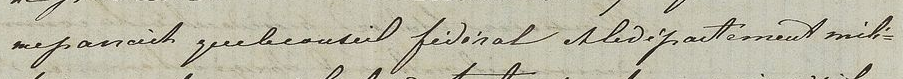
me passait que le conseil fédéral et le département mili-
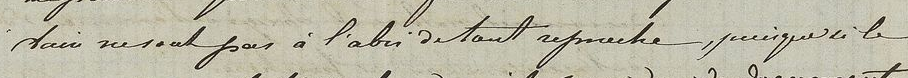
taire ne sont pas à l'abri de tout reproche, puisque si le
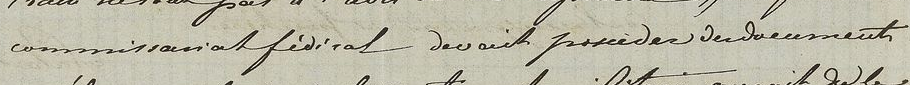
commissariat fédéral devait possèder des documents
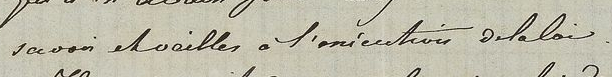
savoir et veiller à l'exécution de la loi.
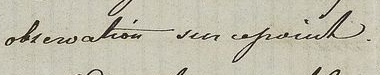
observation sur ce point.
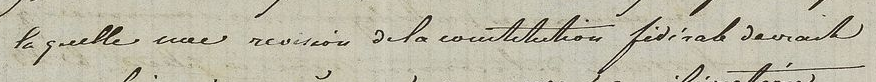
la quelle une revision de la constitution fédérale devrait
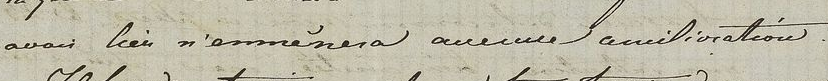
avoir lieu n'amménera aucune amélioration.
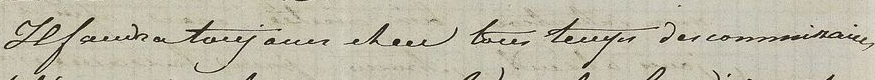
Il faudra toujours etre tous temps des commissaires
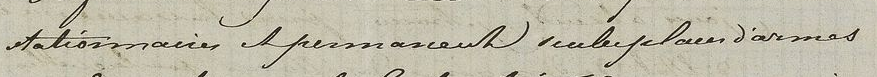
stationnaires et permanent sur les places d'armes
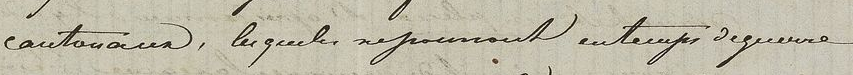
cantonaux, lesquels ne pourront en temps de guerre
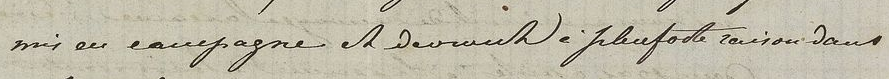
mis en compagne et devront à plus forte raison dans
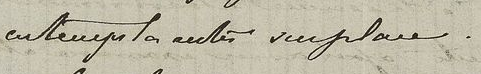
ces temps la rester sur place.
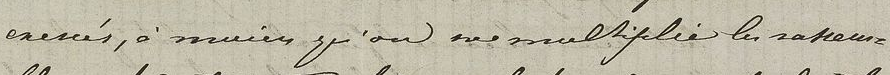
exercés, à mieux qu'on ne multiplie les rassem-
